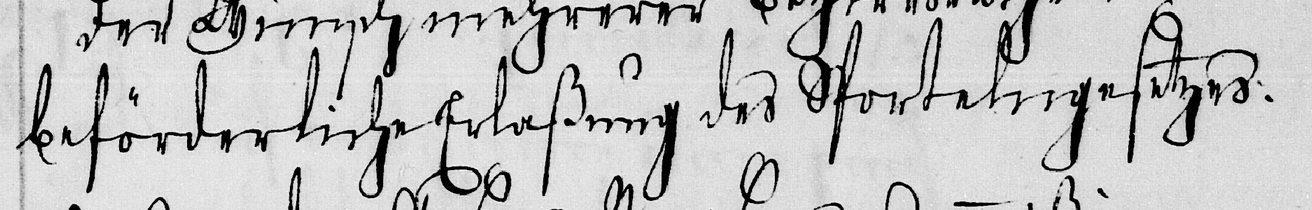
beförderliche Erlaßung des Sportelngesetzes.
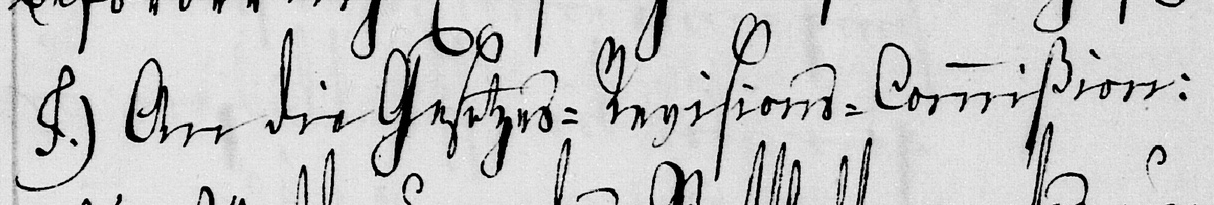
F.) An die Gesetzes-Revisions-Commißion:
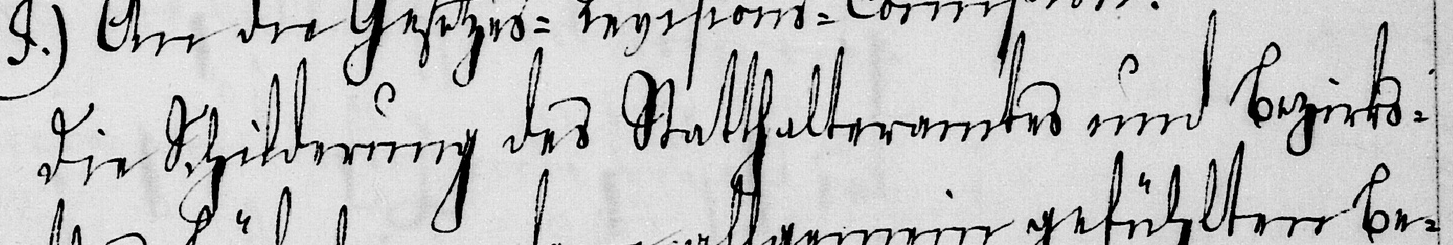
Die Schilderung des Statthalteramtes und Bezirks¬
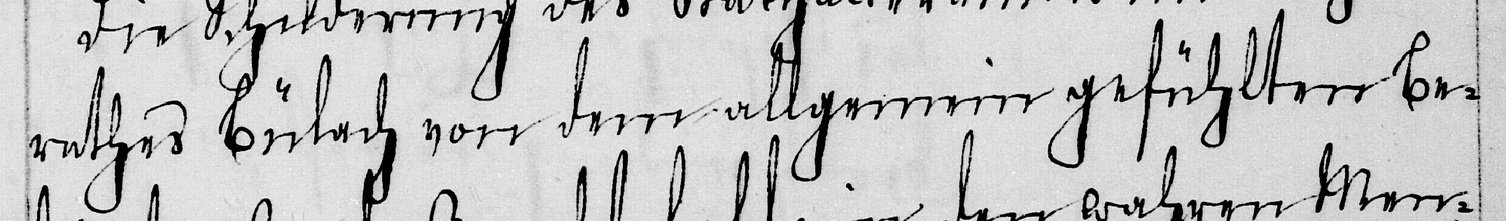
rathes Bülach von dem allgemein gefühlten Be¬
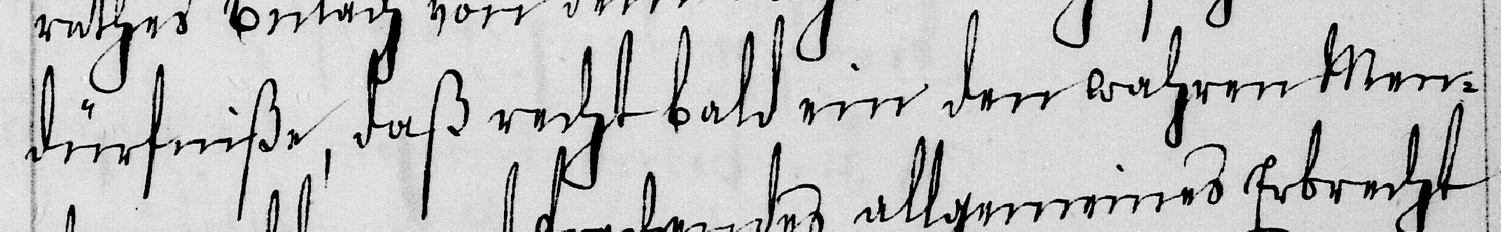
dürfniße, daß recht bald ein den wahren Men¬
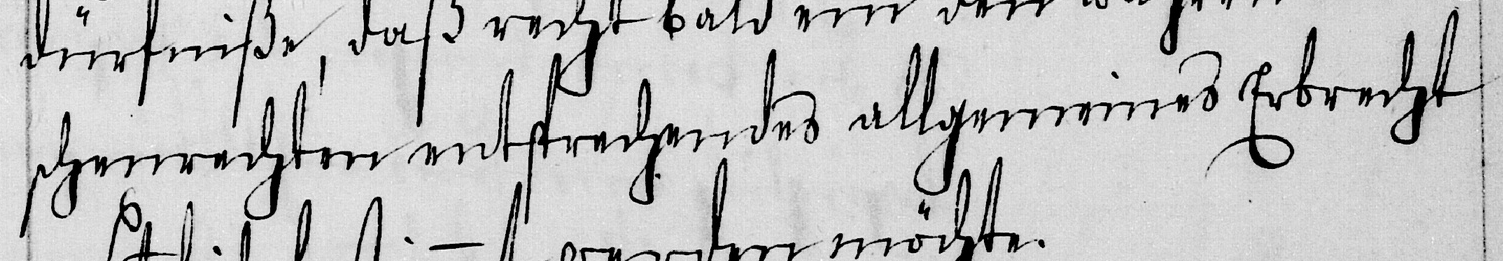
schenrechten entsprechendes allgemeines Erbrecht
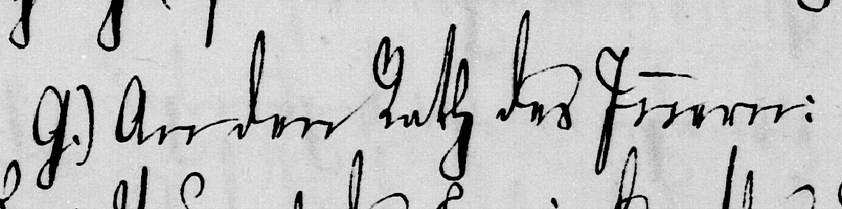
G.) An den Rath des Innern:
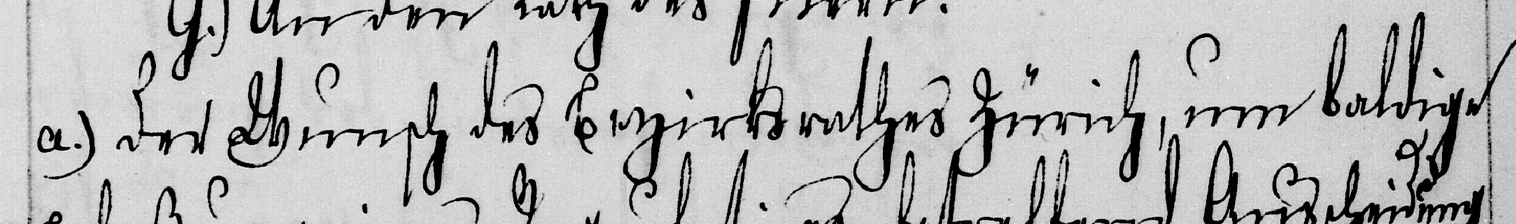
a.) Der Wunsch des Bezirksrathes Zürich, um baldige
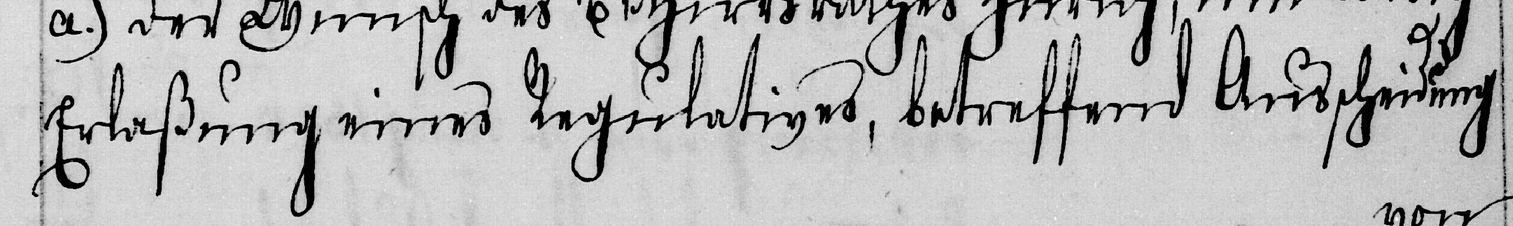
Erlaßung eines Regulatives, betreffend Ausscheidung
